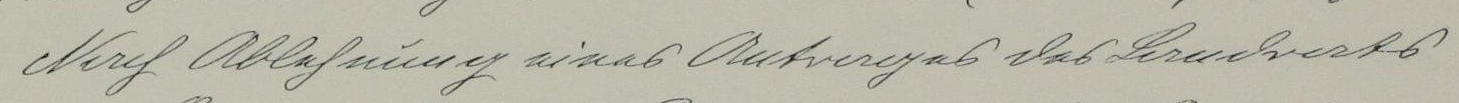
Nach Ablehnung eines Antrages des Landrats
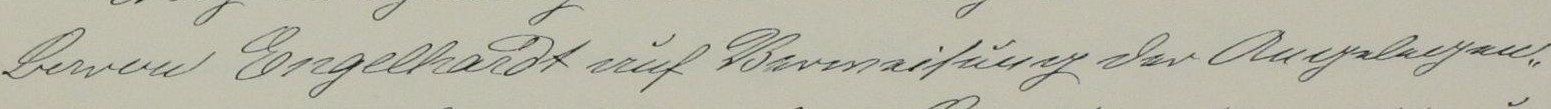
Baron Engelhardt auf Verweisung der Angelegen-
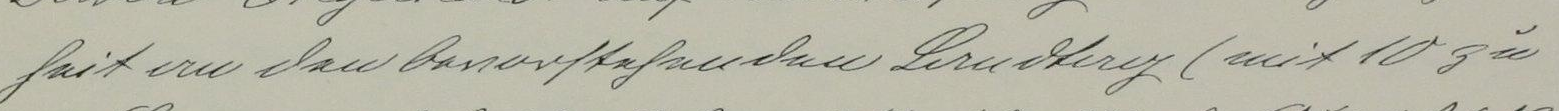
heit an den bevorstehenden Landtag (mit 10 zu
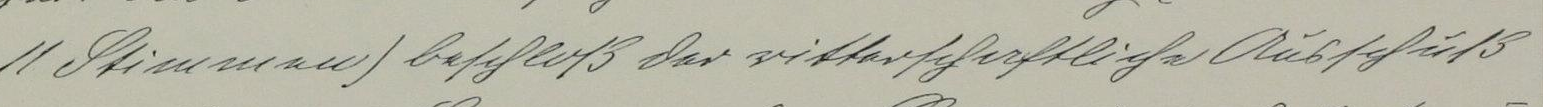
11 Stimmen) beschloß der ritterschaftliche Ausschuß
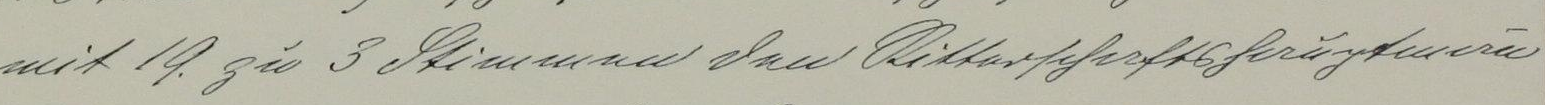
mit 19. zu 3 Stimmen den Ritterschaftshauptmann
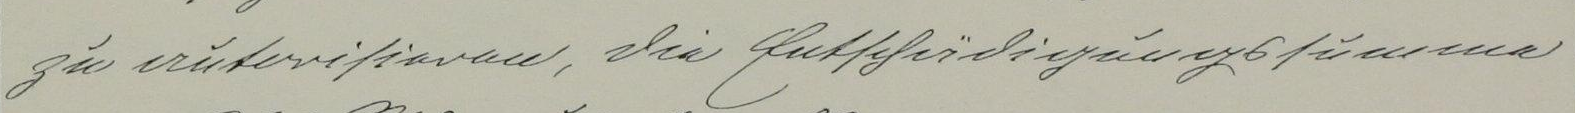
zu autorisieren, die Entschädigungssumme
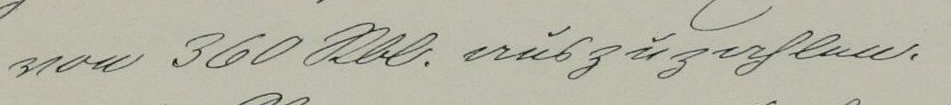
von 360 Rbl. auszuzahlen.
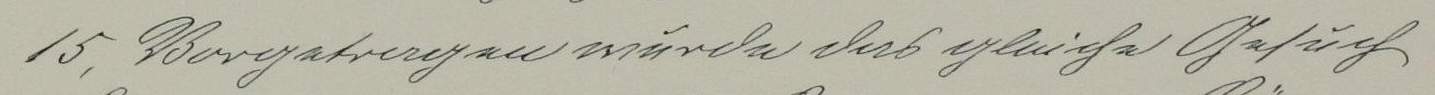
15. Vorgetragen wurde das gleiche Gesuch
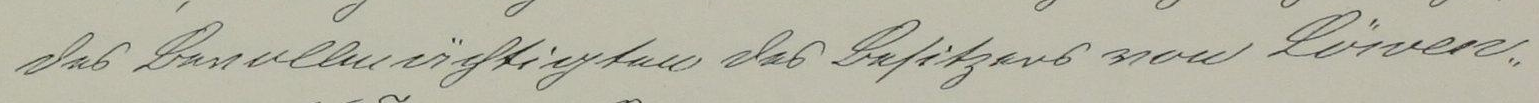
des Bevollmächtigten des Besitzers von Löwen-
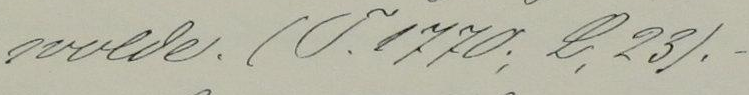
wolde. (T.1770; L.23).
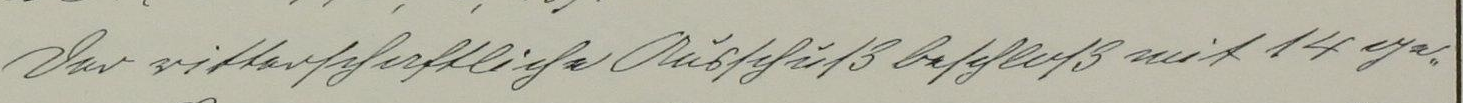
Der ritterschaftliche Ausschuß beschloß mit 14 ge-
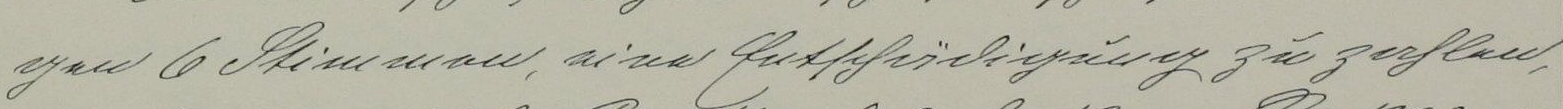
gen 6 Stimmen, eine Entschädigung zu zahlen,
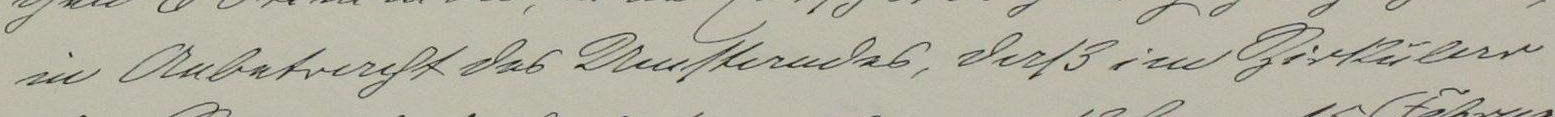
in Anbetracht des Umstandes, daß im Zirkular
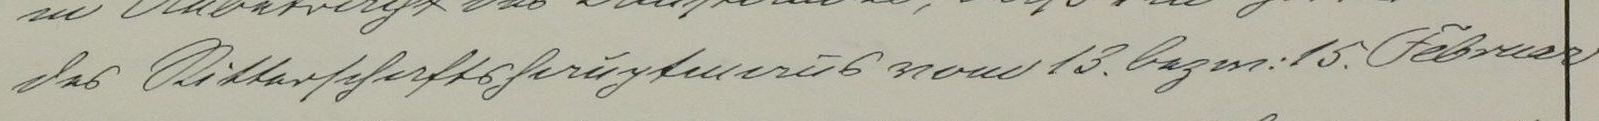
des Ritterschaftshauptmanns vom 13. bezw. 15. Februar
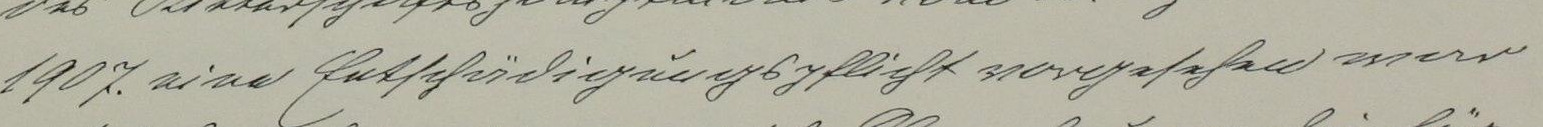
1907. eine Entschädigungspflicht vorgesehen war
